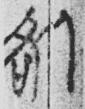咎
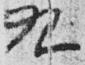九
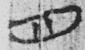四
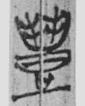豐
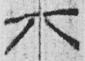亓（其）
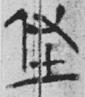坿
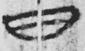日
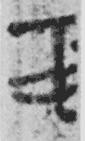𠁩
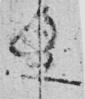見
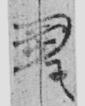斗
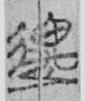遇
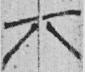亓（其）
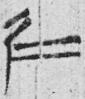○（夷）
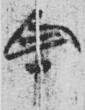○（主）
